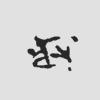取
